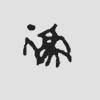像
